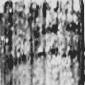上
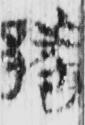都
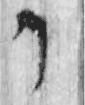人
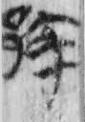○（蔡）
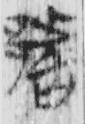都
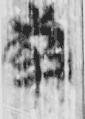南
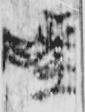陵
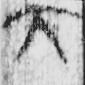大
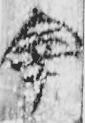宰
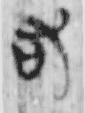右
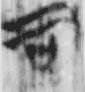司
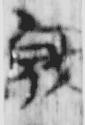○（寇）
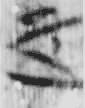正
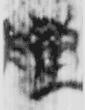○（陳）
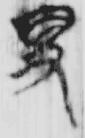𠭁（得）
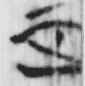正
